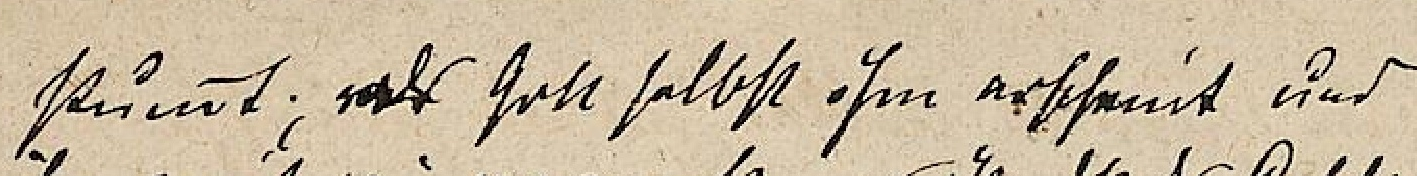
stumt, als Gott selbst ihm erscheint und
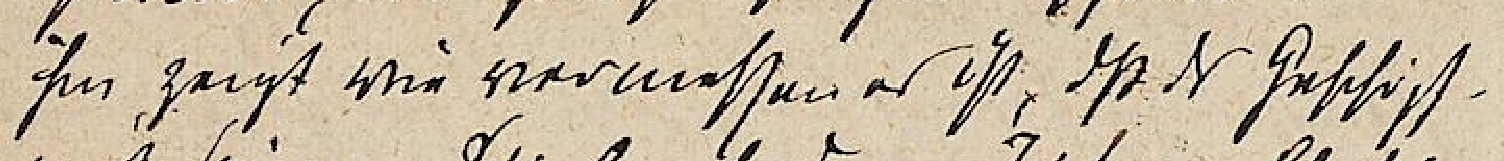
ihm zeigt wie vermessen es ist, dß ds Geschöpf
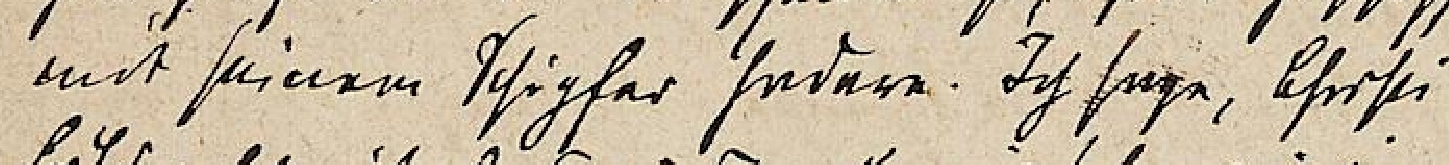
midt seinem Schöpfer hadere. Ich sage, Christi
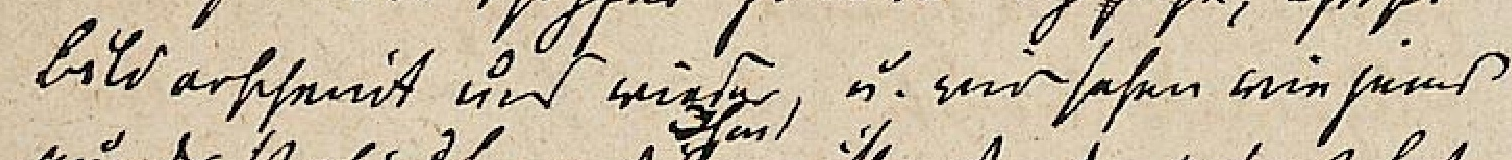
Bild erscheit uns wieder, u. wir sehen wie jenes
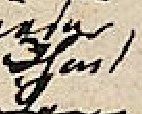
Ihm
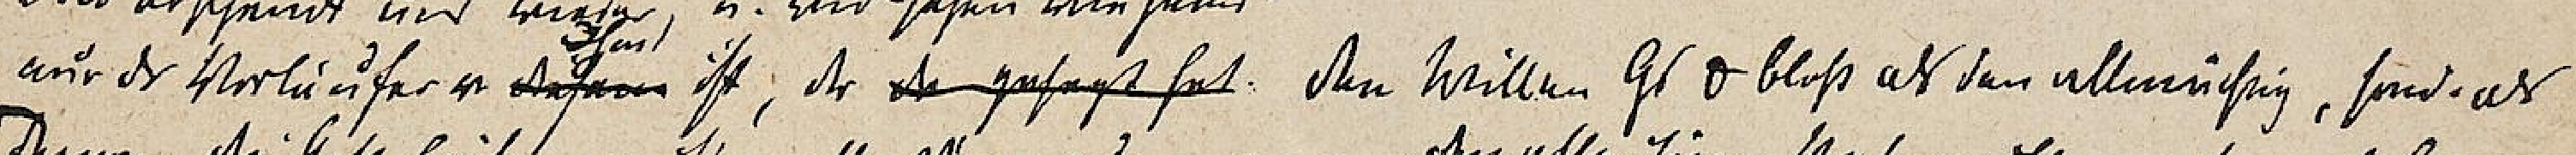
nur dr Vorläufer v diesem ist, der da gesagt het den Willen Gs o bloß als den allmächtig, sond. als
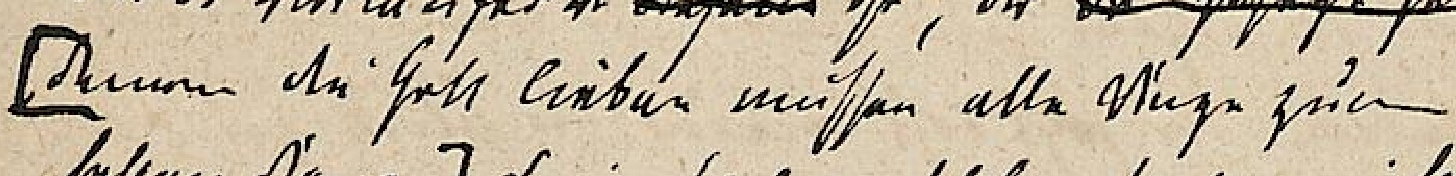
[denen, die Gott, lieben müssen alle Dnge zum
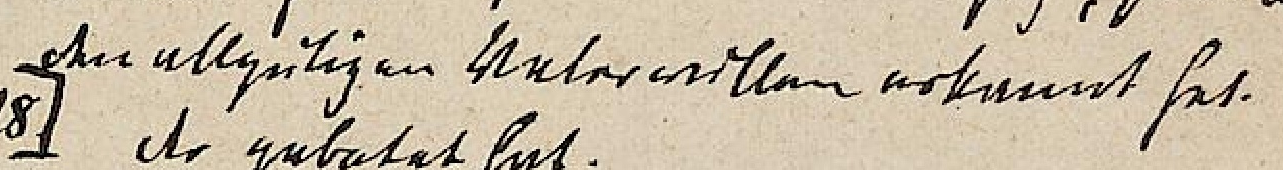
den allgütigen Vaterwillen erkannt hat.
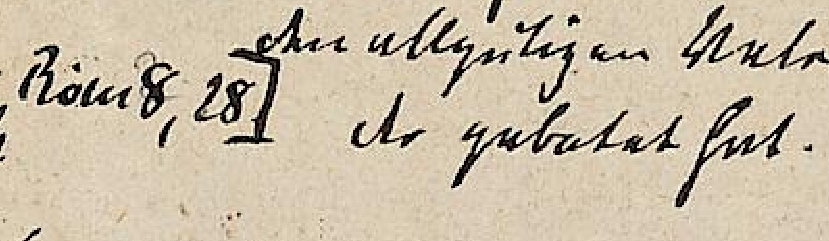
Röm 8,28] der gebetet hat.
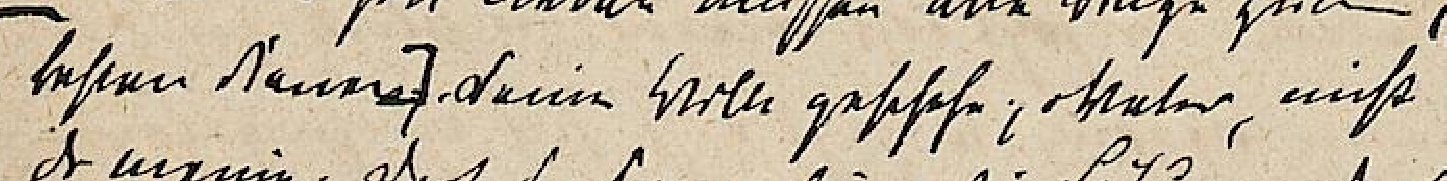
besten dienen] dein Wille geschehe, Vater, nicht
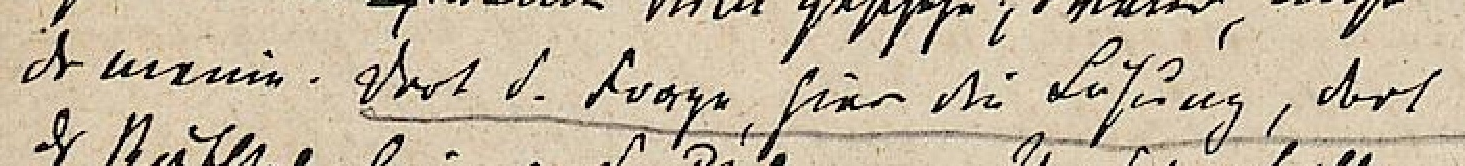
dr meine. Dort d. Frage, hier die Lösung, dort
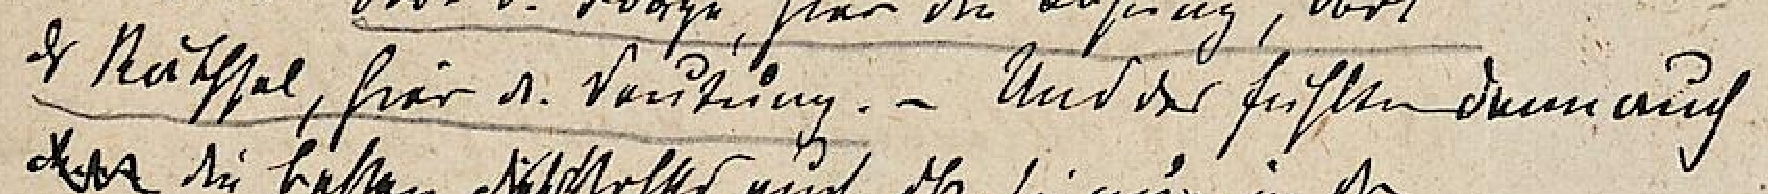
ds Rätssel, hier d. Deutung._ Und das fühlten denn auch
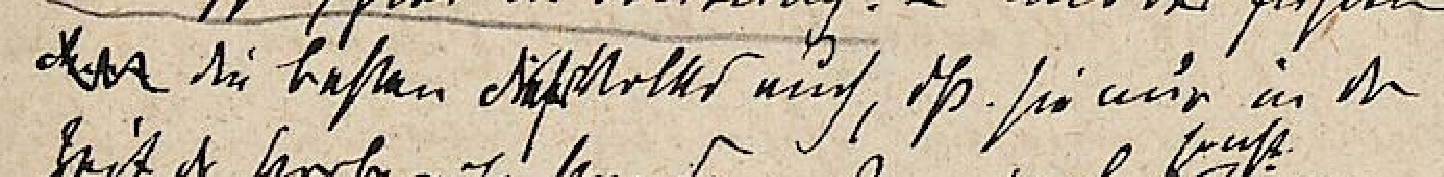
dem die besten dieses Volkes auch, dß sie nur in der
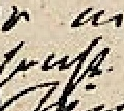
sonst
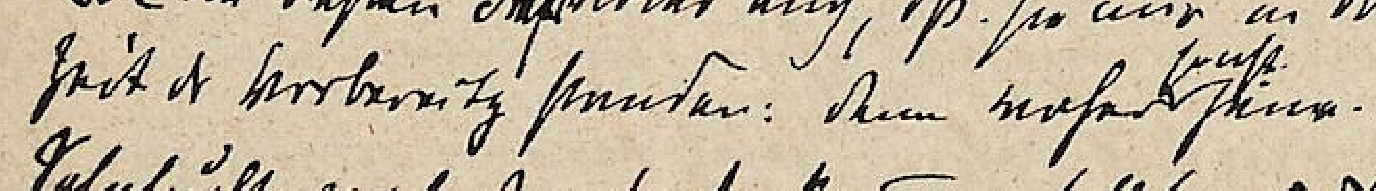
Zeit dr Vorbereitg. standen: den woher jene.
